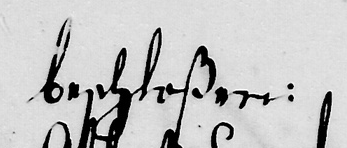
beschloßen:
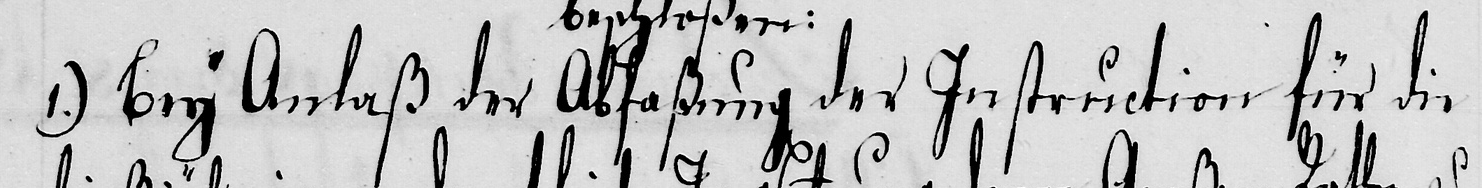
1.) Bey Anlaß der Abfaßung der Instruction für die
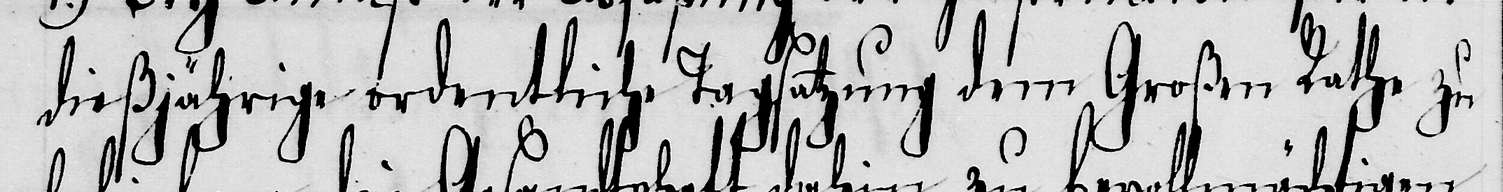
dießjährige ordentliche Tagsatzung dem Großen Rathe zu
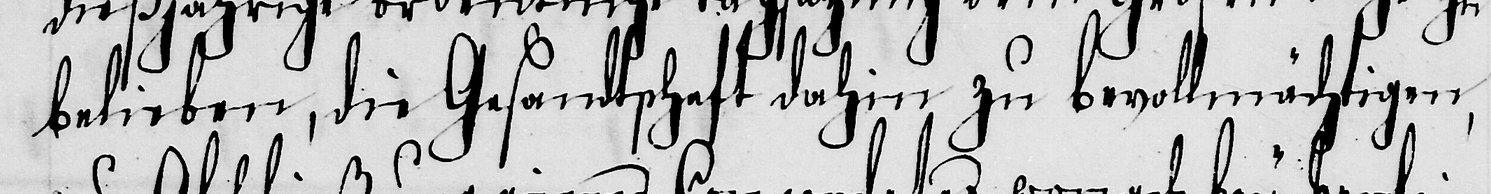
belieben, die Gesandtschaft dahin zu bevollmächtigen,
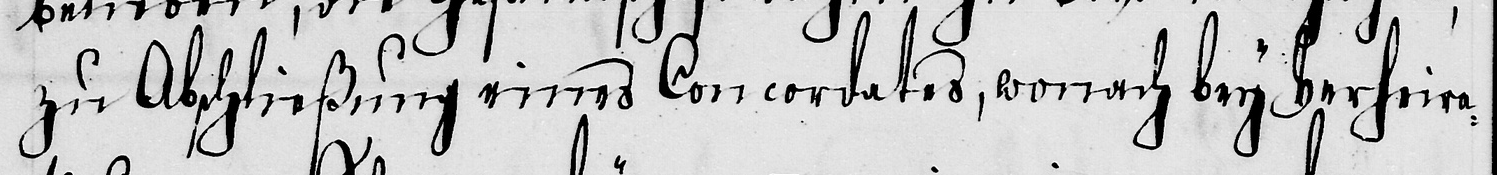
zu Abschließung eines Concordates, wonach bey Verheira¬
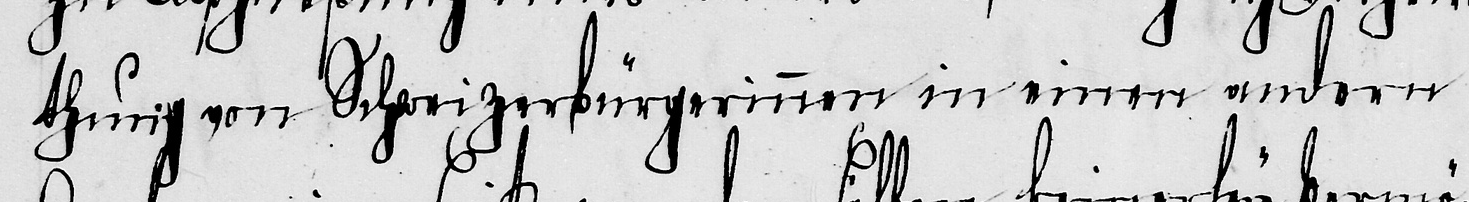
thung von Schweizerbürgerinnen in einen andern
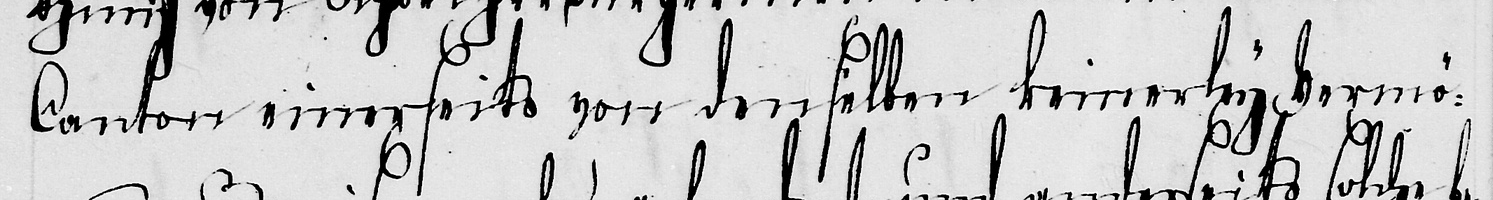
Canton einerseits von denselben keinerley Vermö¬
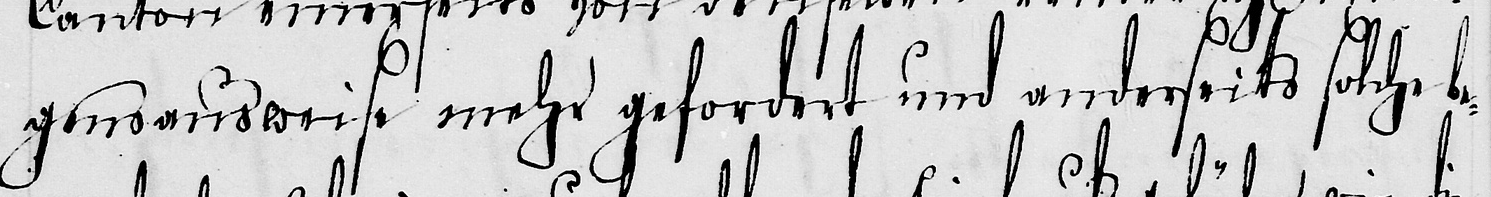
gensausweise mehr gefordert und anderseits solche
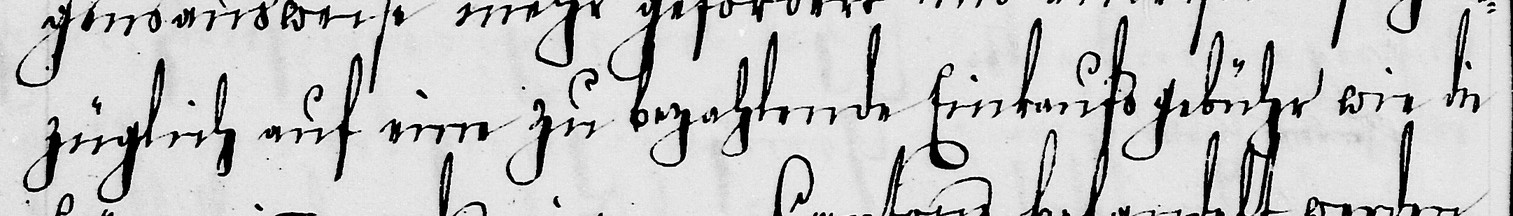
züglich auf eine zu bezahlende Einkaufsgebühr wie d¬
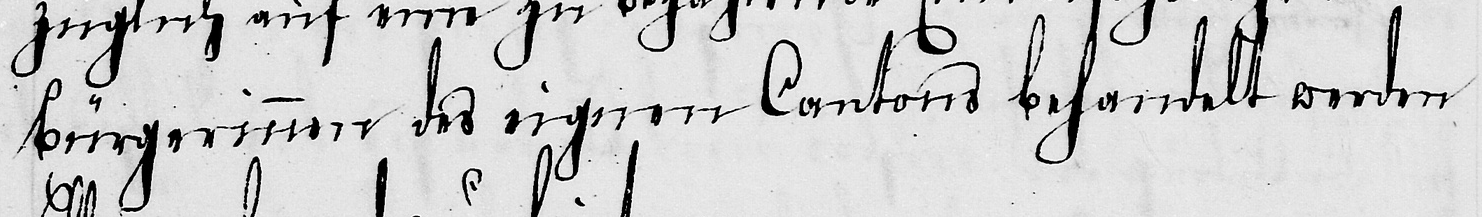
Bürgerinnen des eignen Cantons behandelt werden
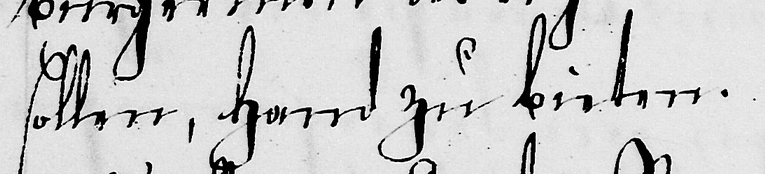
sollen, Hand zu bieten.
